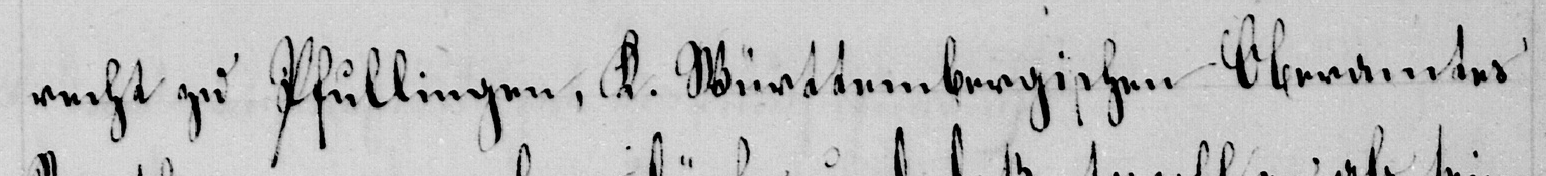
recht zu Pfullingen, K. Württembergischen Oberamtes
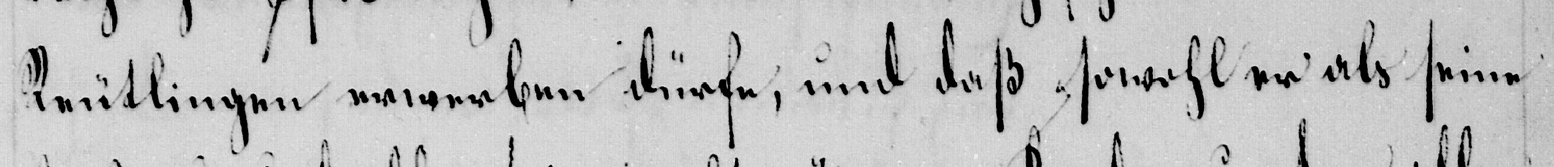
Reutlingen erwerben dürfe, und daß sowohl er als seine
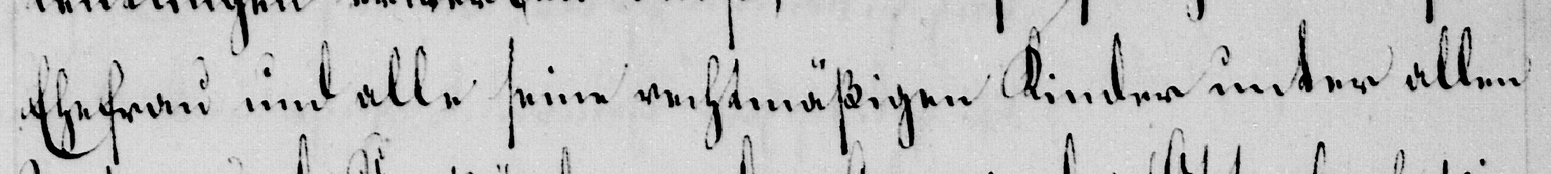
Ehefrau und alle seine rechtmäßigen Kinder unter allen
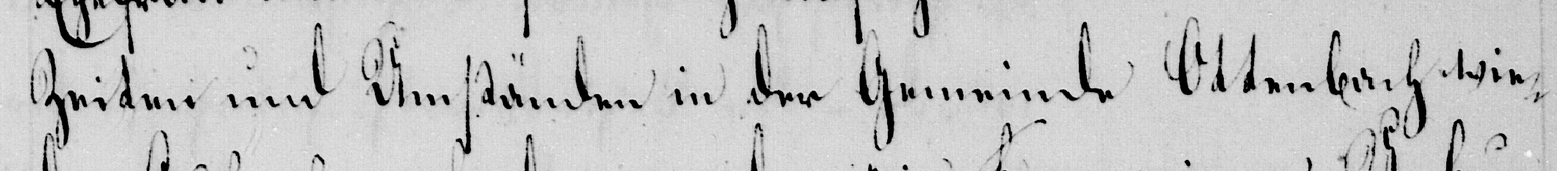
Zeiten und Umständen in der Gemeinde Ottenbach wie¬
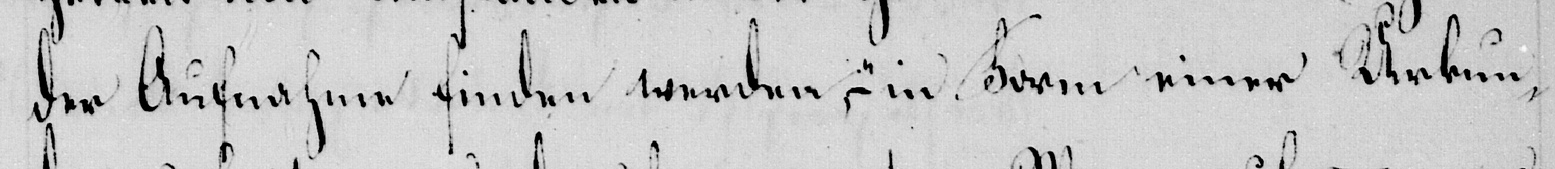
der Aufnahme finden werden“, – in Form einer Urkun¬
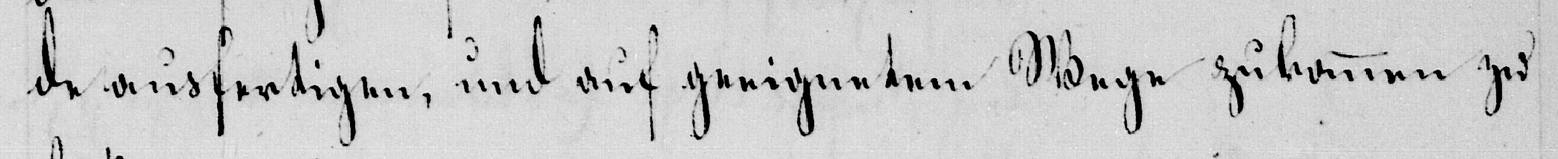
de ausfertigen, und auf geeignetem Wege zukommen zu
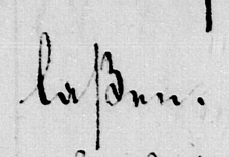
laßen.
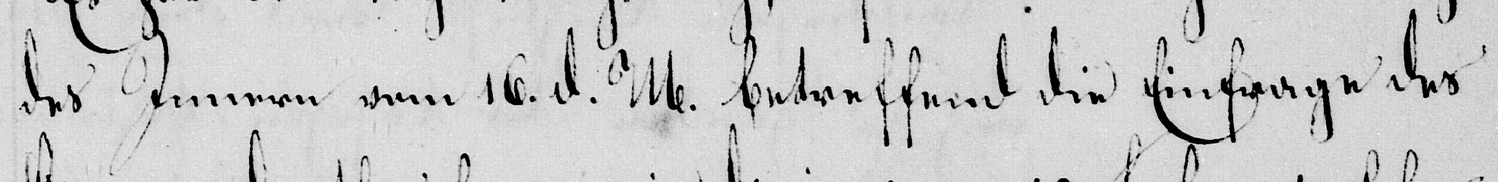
des Innern vom 16. d. M. betreffend die Einfrage des
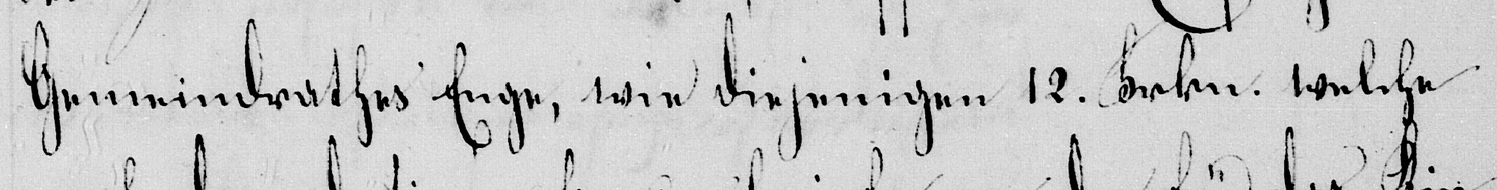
Gemeindrathes Enge, wie diejenigen 12. Frkn. welche
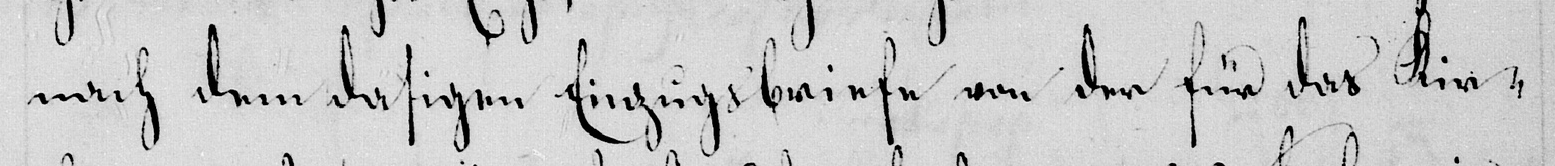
nach dem dasigen Einzugsbriefe von der für das Kir¬
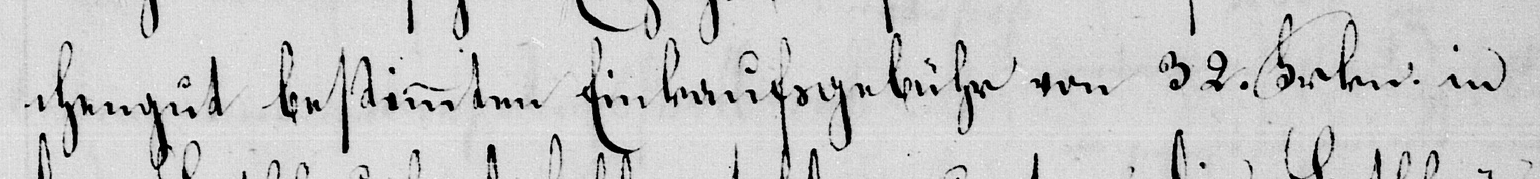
chengut bestimmten Einkaufsgebühr von 32. Frkn. in
